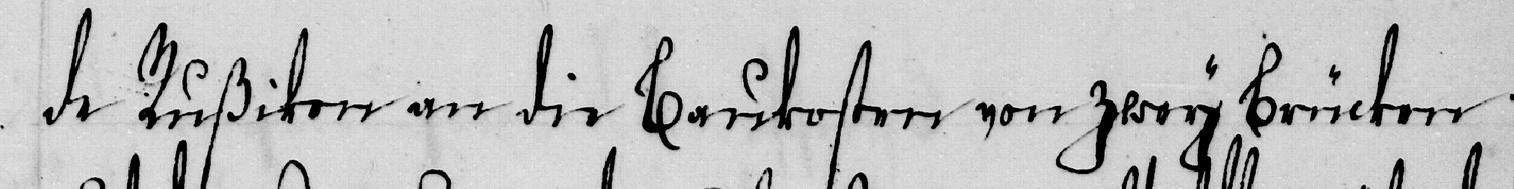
de Rußikon an die Baukosten von zwey Brücken
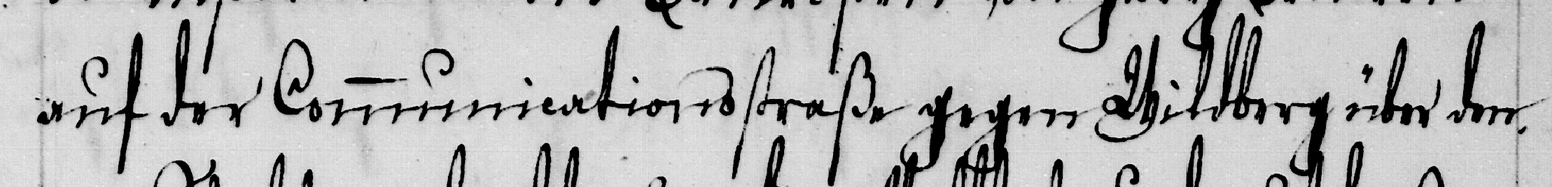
auf der Communicationsstraße gegen Wildberg über den
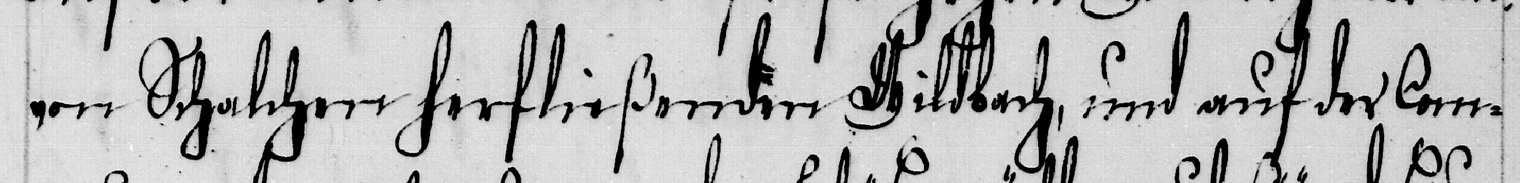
von Schalchen herfließenden Wildbach, und auf der Com¬
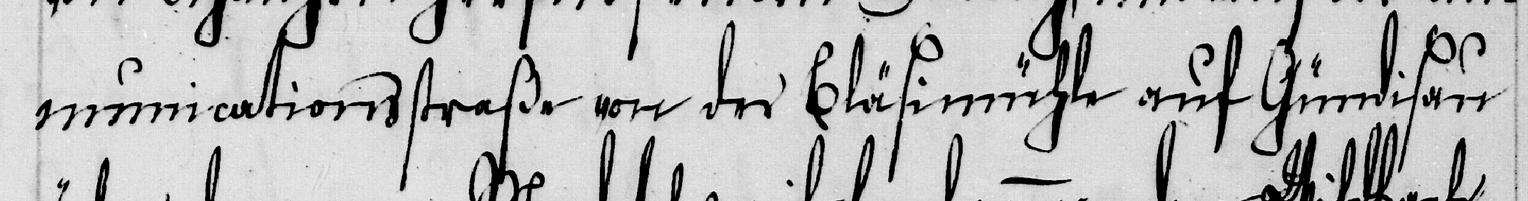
municationsstraße von der Bläsimühle auf Gündisau
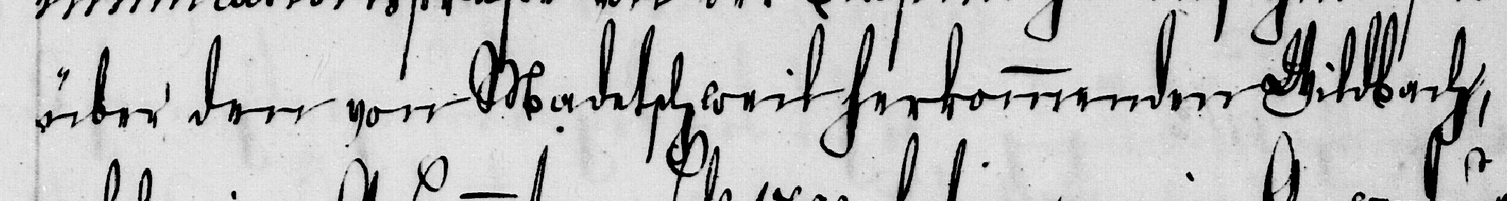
über den von Madetschweil herkommenden Wildbach,
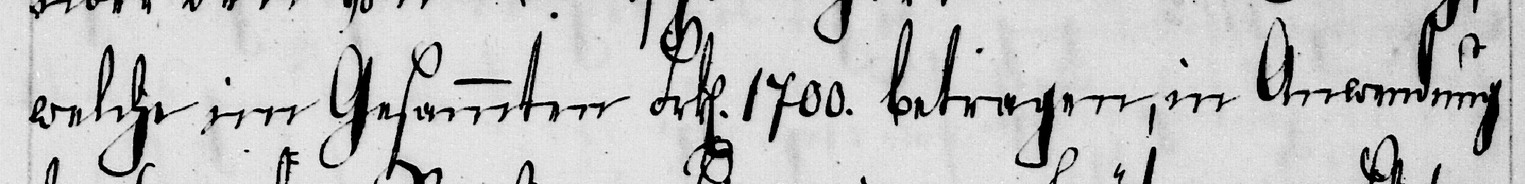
welche im Gesammten Frk[en]. 1700. betragen, in Anwendung
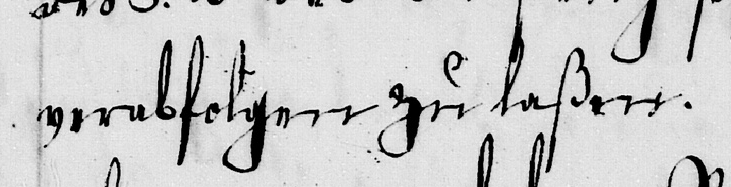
verabfolgen zu laßen.
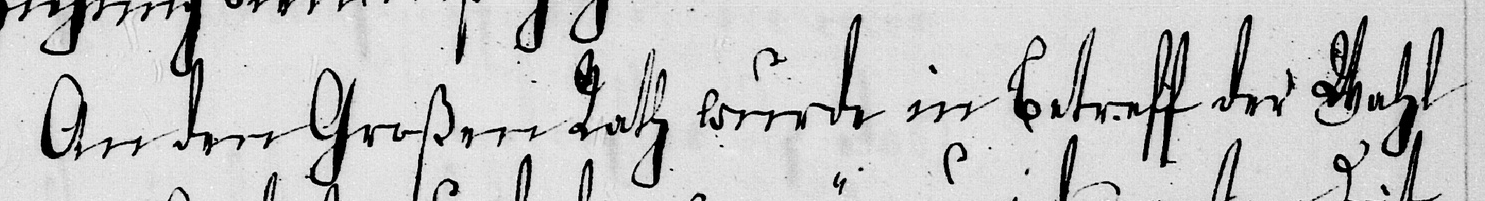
An den Großen Rath wurde in Betreff der Wahl
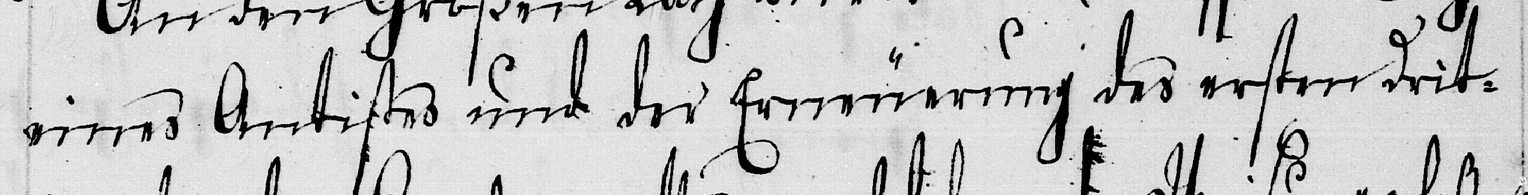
eines Antistes und der Erneuerung des ersten Drit¬
